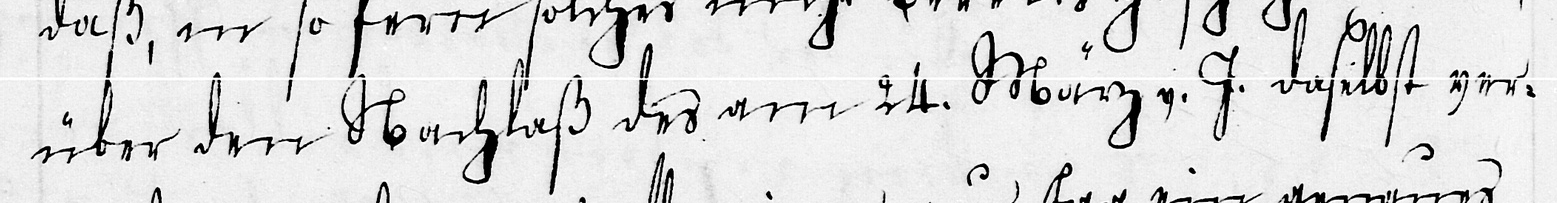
über den Nachlaß des am 24. März v. J. daselbst ver¬
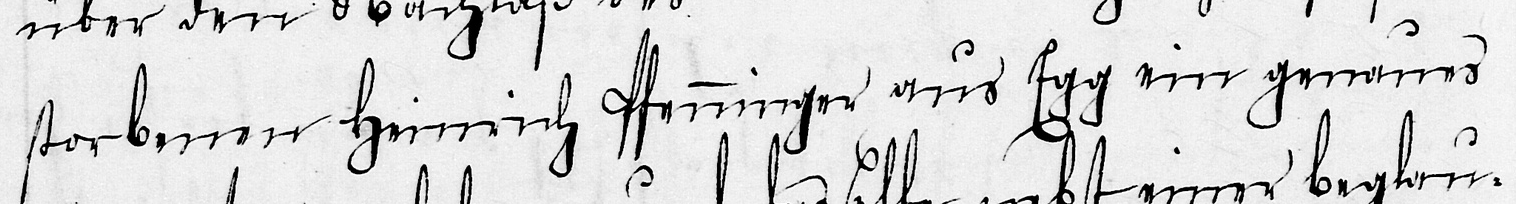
storbenen Heinrich Pfenninger aus Egg ein genaues
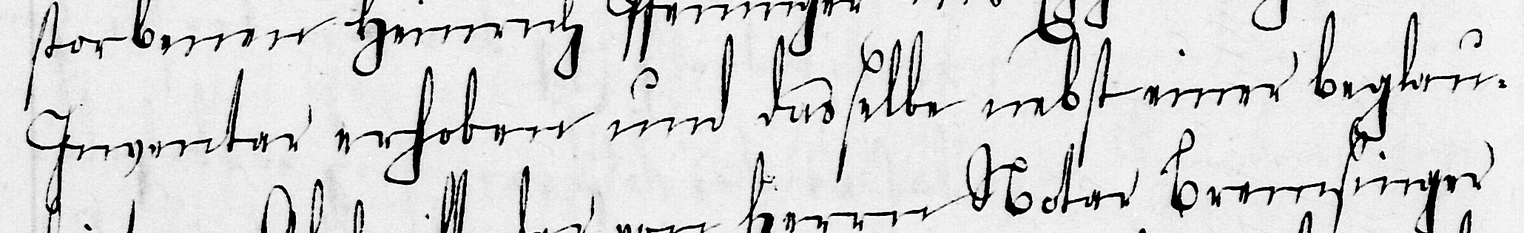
Inventar erhoben und dasselbe nebst einer beglau¬
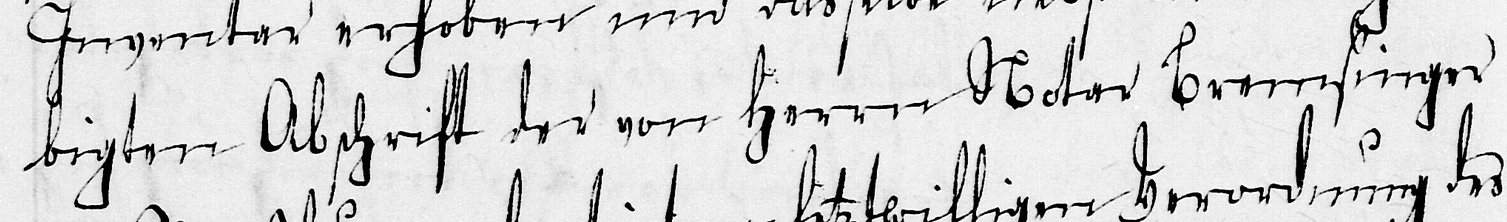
bigten Abschrift der von Herrn Notar Bremsinger
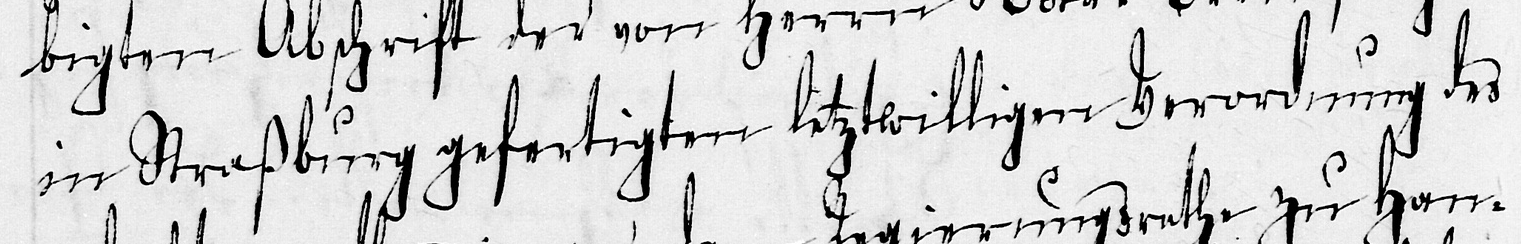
in Straßburg gefertigten letztwilligen Verordnung des
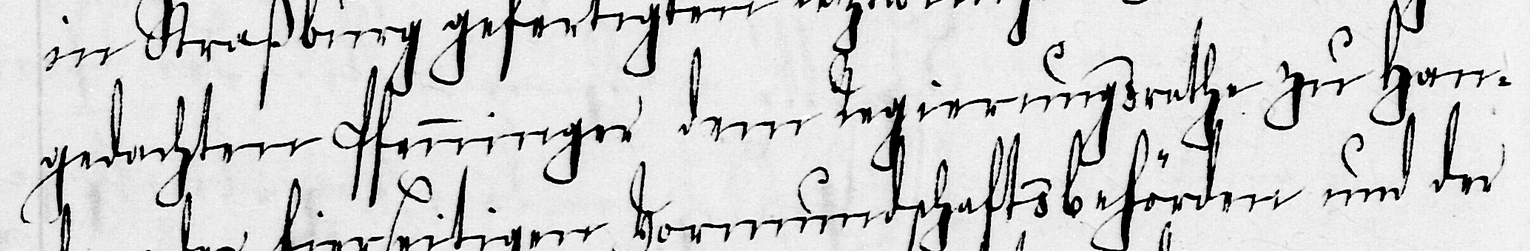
gedachten Pfenninger dem Regierungsrathe zu Han¬
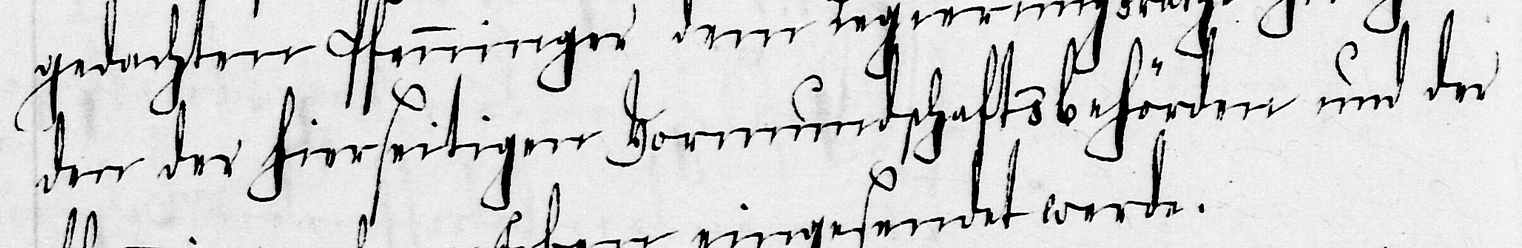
den der hierseitigen Vormundschaftsbehörden und der
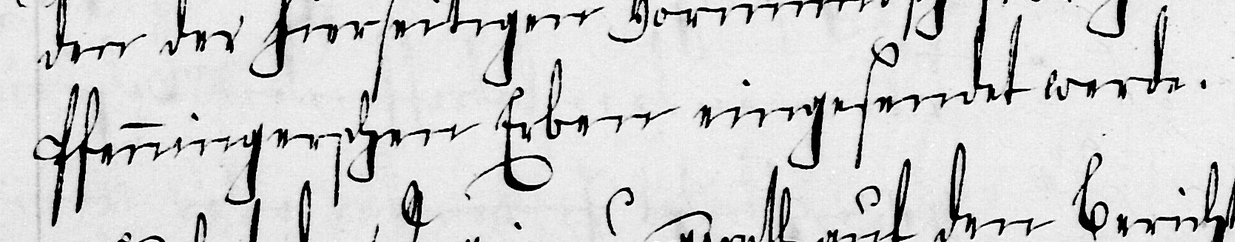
Pfenningerschen Erben eingesendet werde.
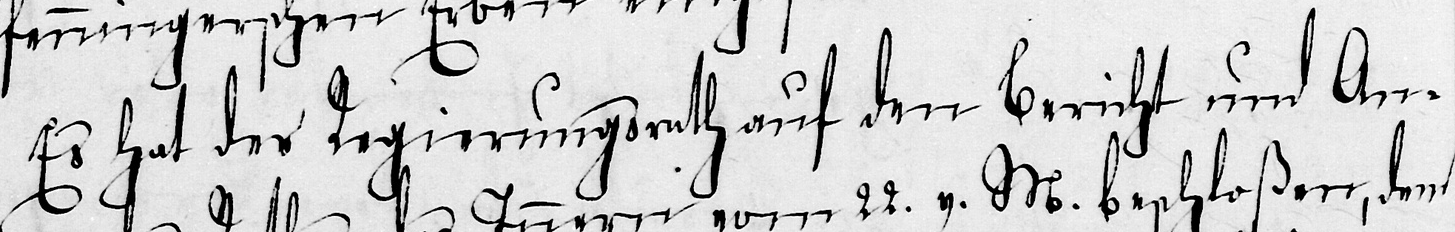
Es hat der Regierungsrath auf den Bericht und An¬
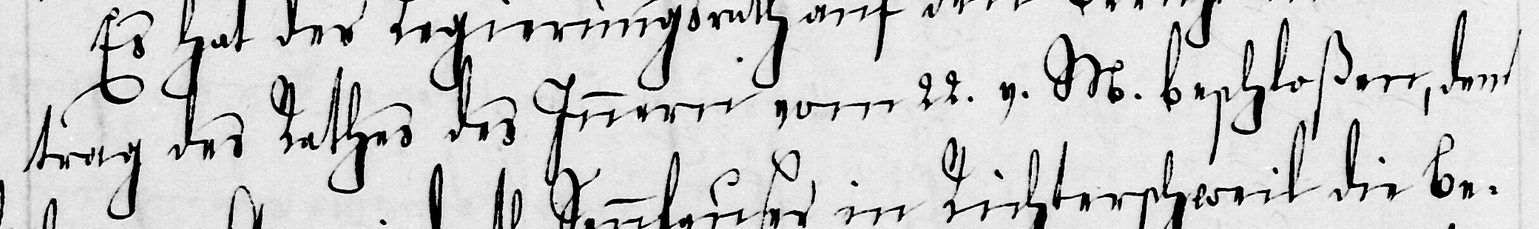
trag des Rathes des Innern vom 22. v. M. beschloßen, dem
